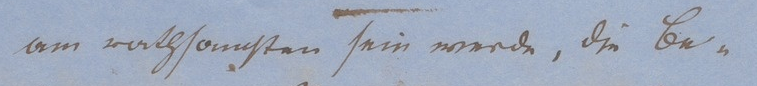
am rathsamsten sein werde, die Be-
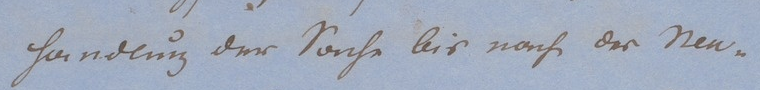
handlung der Sache bis nach der Neu-
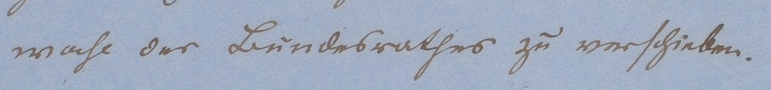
wahl des Bundesrathes zu verschieben.
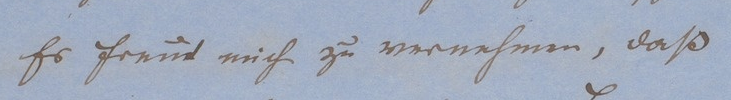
Es freut mich zu vernehmen, daß
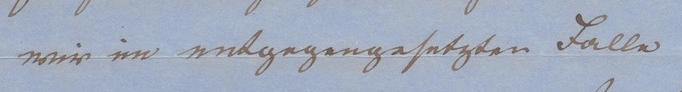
wir im entgegengesetzten Falle
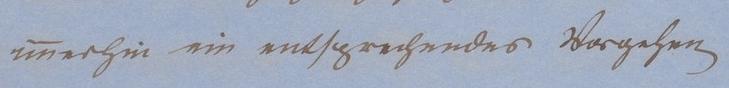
immerhin ein entsprechendes Vorgehen
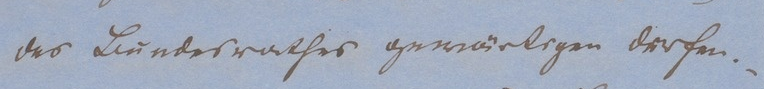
des Bundesrathes gewärtigen dürfen. –
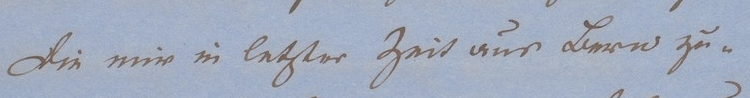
Die mir in letzter Zeit aus Bern zu-
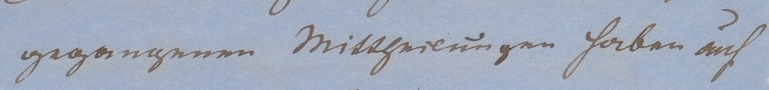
gegangenen Mittheilungen haben auf
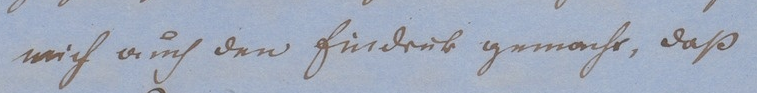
mich auch den Eindruk gemacht, daß
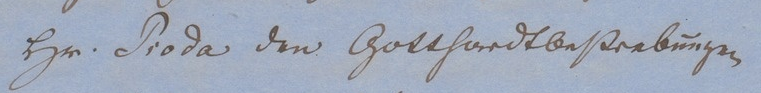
Hr. Pioda den Gotthardtbestrebungen
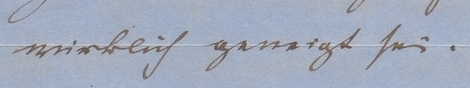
wirklich geneigt sei.
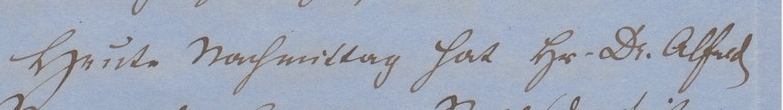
Heute Nachmittag hat Hr. Dr. Alfred
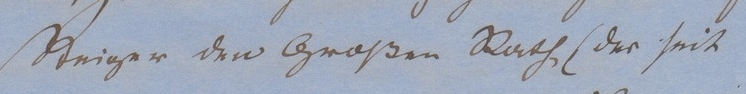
Steiger den Großen Rath (der seit
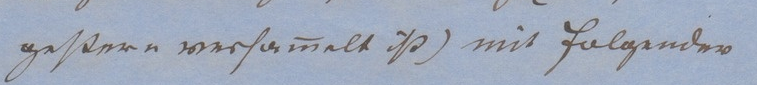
gestern versammelt ist) mit folgender
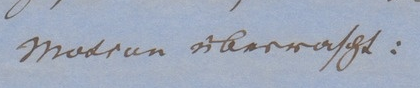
Motion überrascht:
